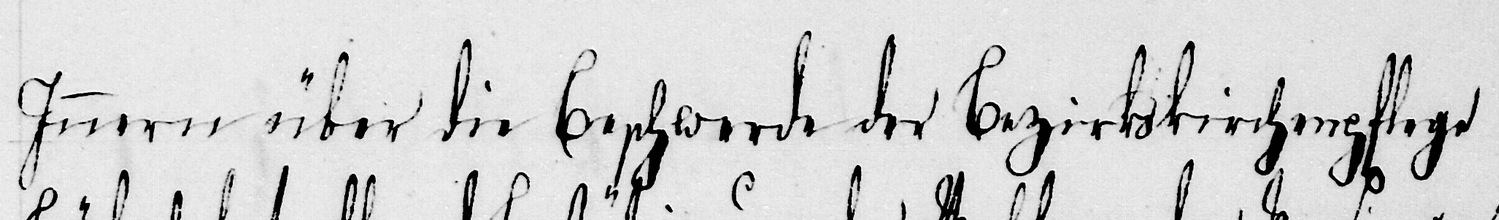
Innern über die Beschwerde der Bezirkskirchenpflege
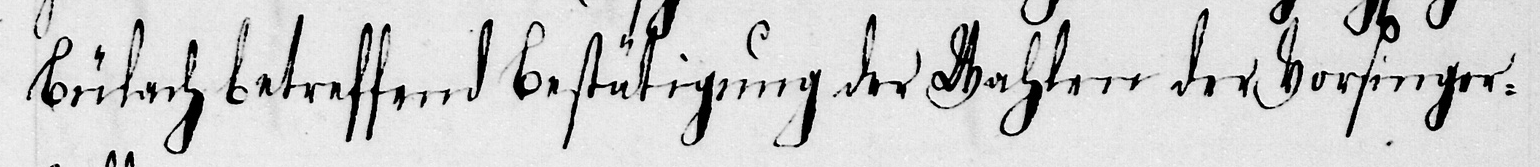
Bülach betreffend Bestätigung der Wahlen der Vorsinger¬
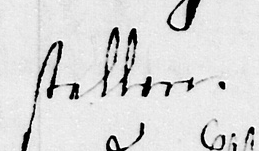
stellen.
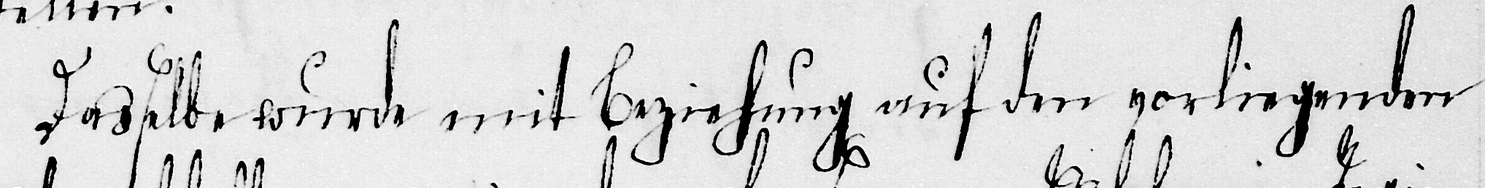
Dasselbe wurde mit Beziehung auf den vorliegenden
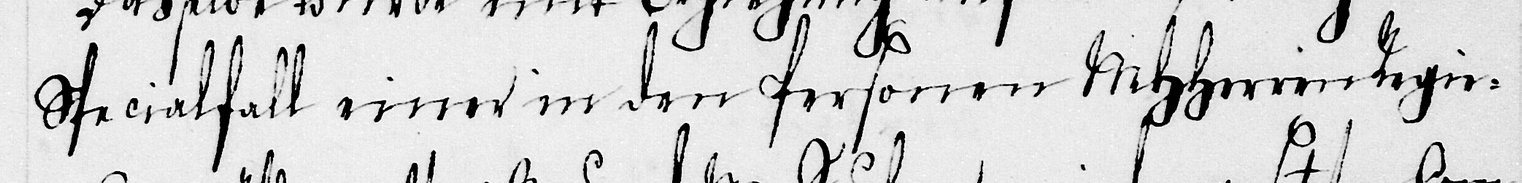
Specialfall einer in den Personen MHHerren Regie¬
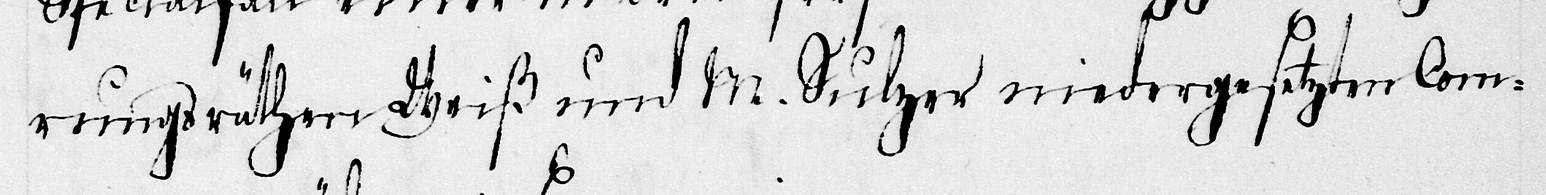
rungsräthen Weiß und M. Sulzer niedergesetzten Com¬
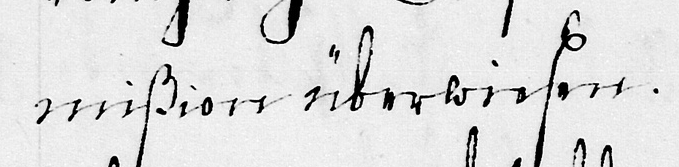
mißion überwiesen.
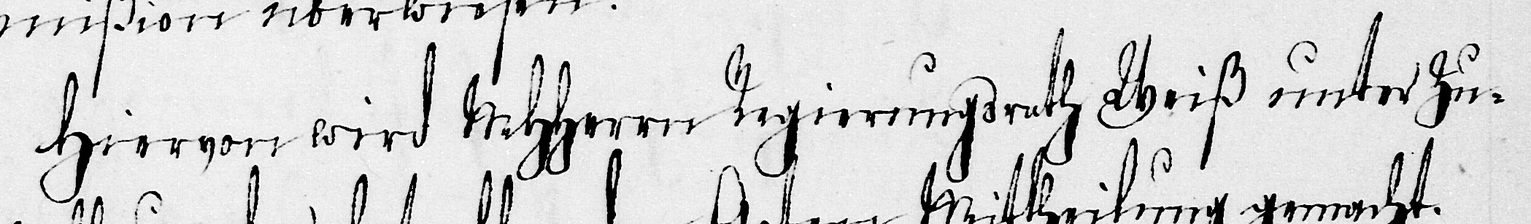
Hiervon wird MHHerrn Regierungsrath Weiß unter Zu¬
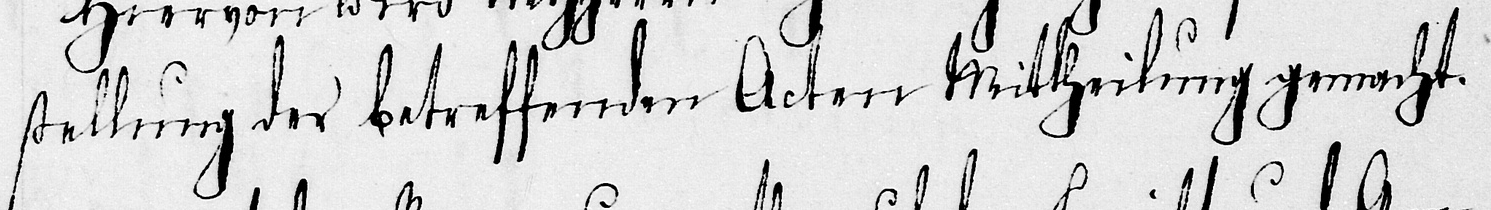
stellung der betreffenden Acten Mittheilung gemacht.
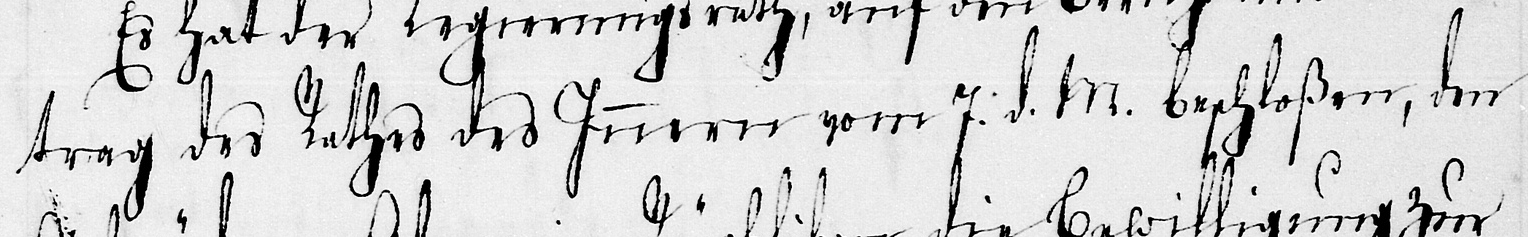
trag des Rathes des Innern vom 7. d. M. beschloßen, den
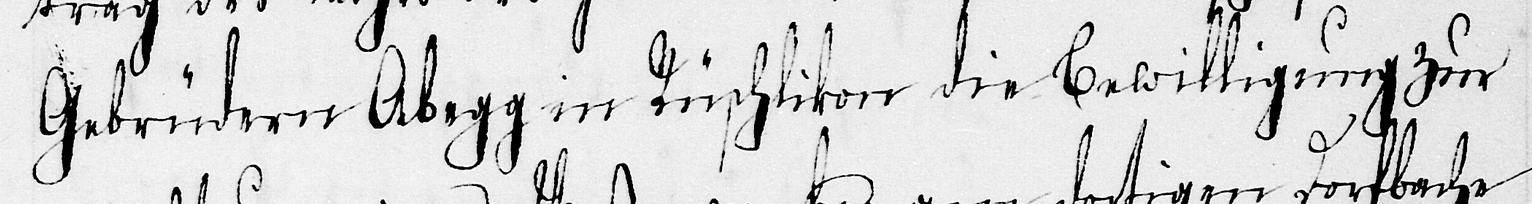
Gebrüdern Abegg in Rüschlikon die Bewilligung zur
